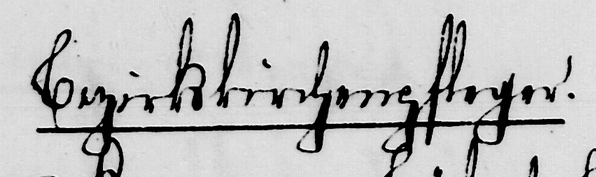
Bezirkskirchenpfleger.
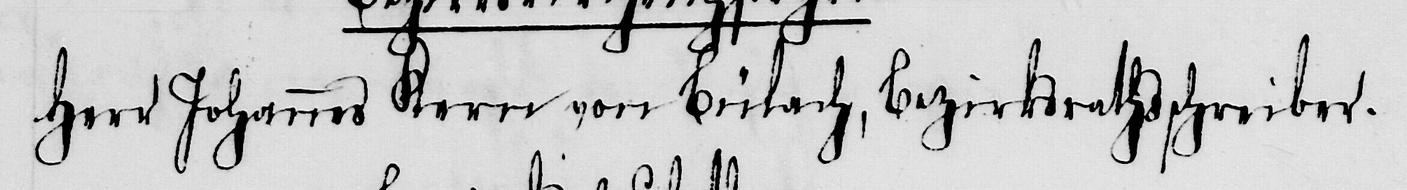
Herr Johannes Kern von Bülach, Bezirksrathsschreiber.
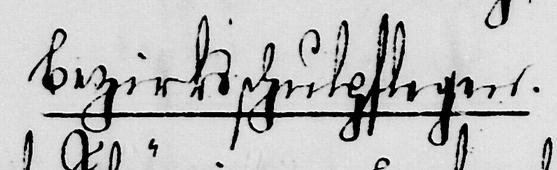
Bezirksschulpfleger.
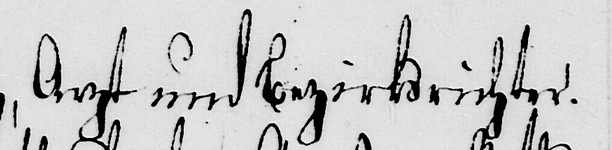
Arzt und Bezirksrichter.
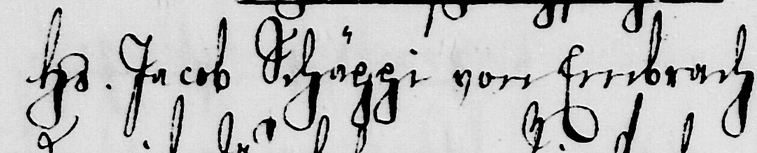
Hs. Jacob Schäppi von Embrach,
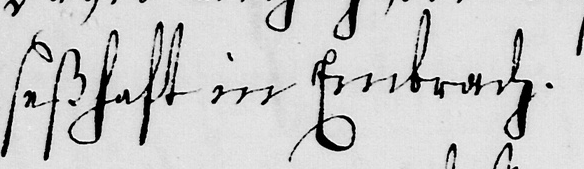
seßhaft in Embrach.
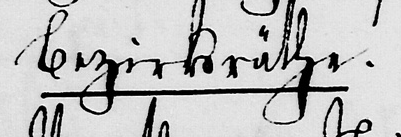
Bezirksräthe.
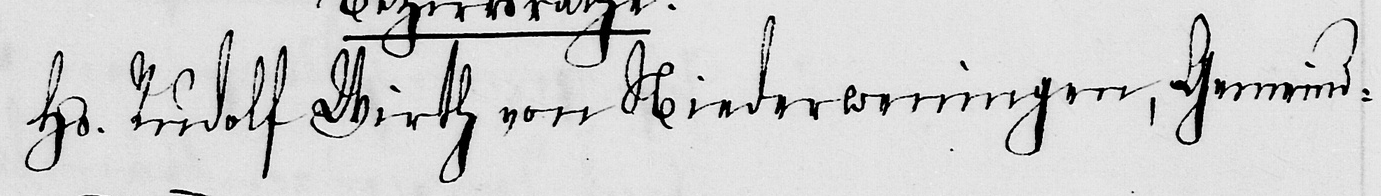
Hs. Rudolf Wirth von Niederweningen, Gemeind¬
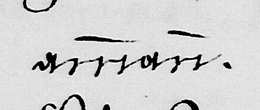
ammann.
